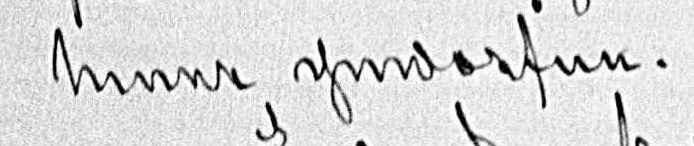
Meer geworfen.
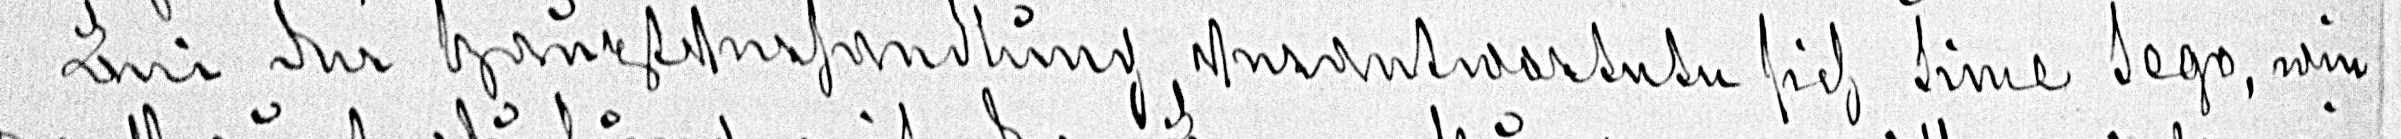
Bei der Hauptverhandlung verantworteten sich Šime Šego, wie
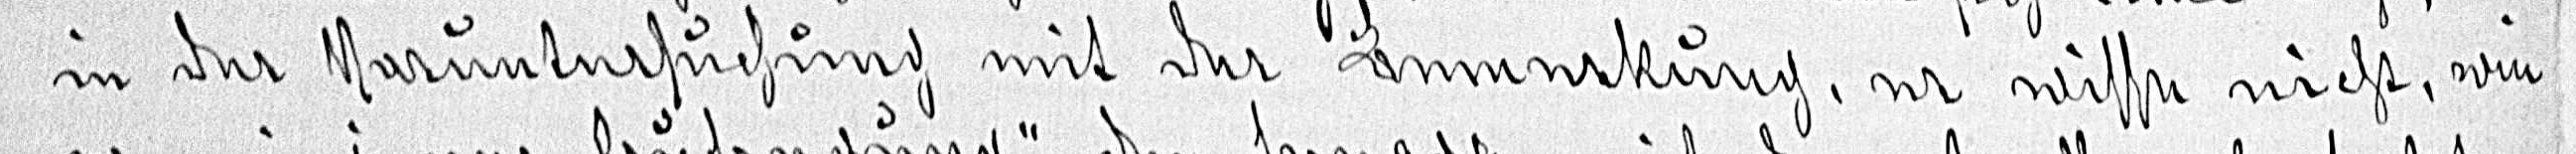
in der Voruntersuchung mit der Bemerkung, er wisse nicht, wie
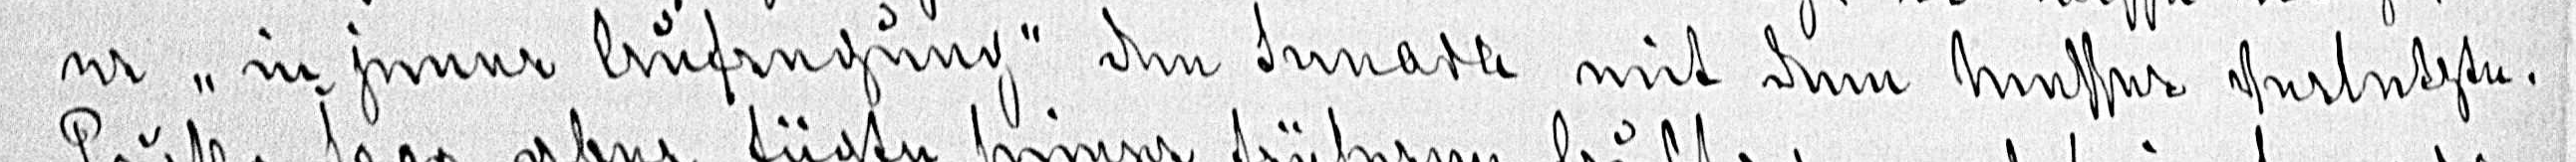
er „in jener Aufregung“ den Iunara mit dem Messer verletzte.
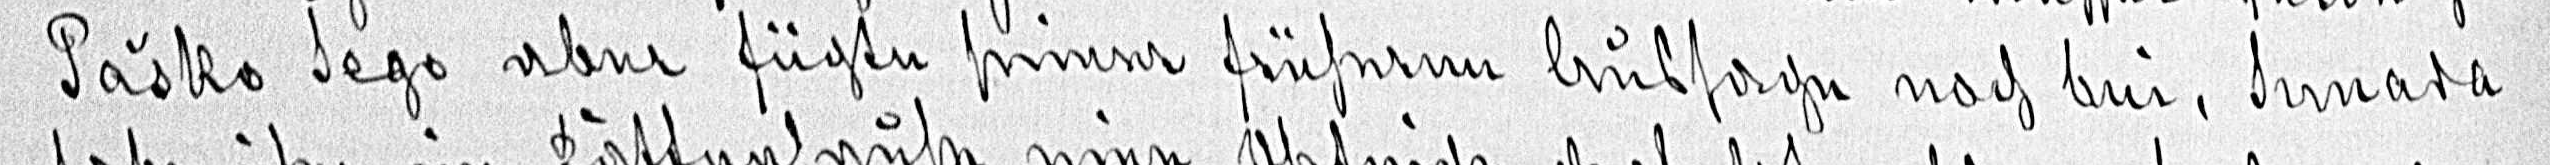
Paško Šego aber fügte seiner früheren Aussage noch bei, Iunara
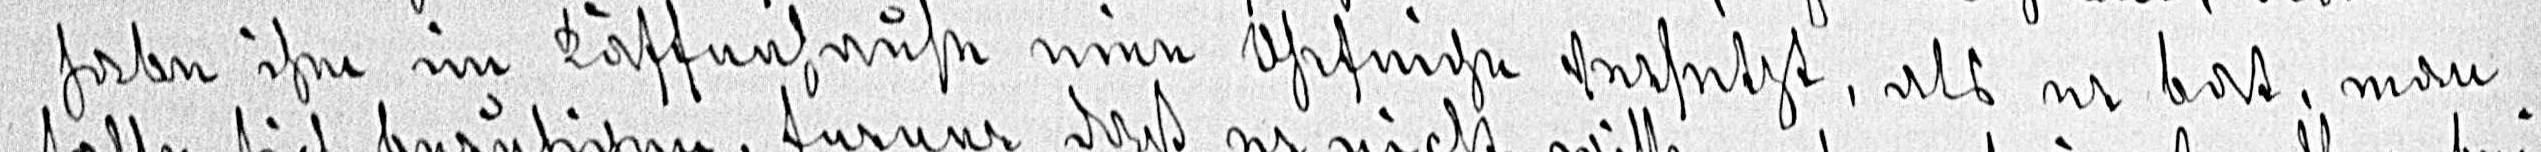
habe ihm im Kaffeehause eine Ohrfeige verletzt, als er bat, man
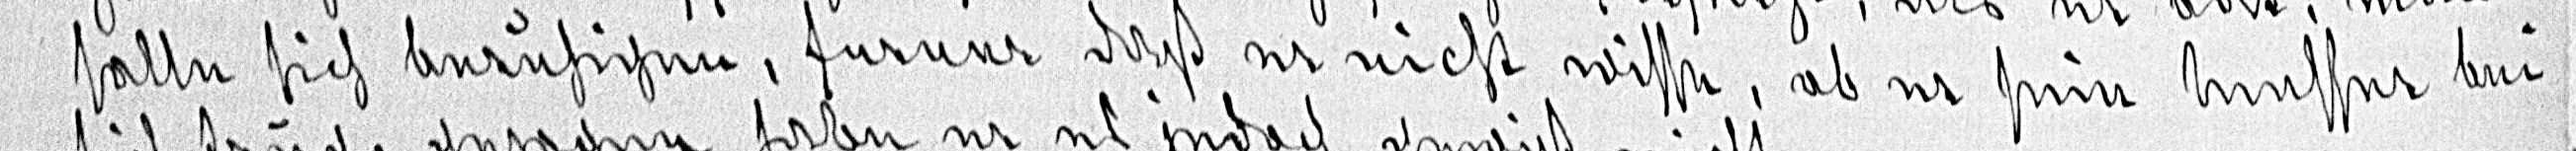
solle sich beruhigen, ferner daß er nicht wisse, ob es sein Messer bei
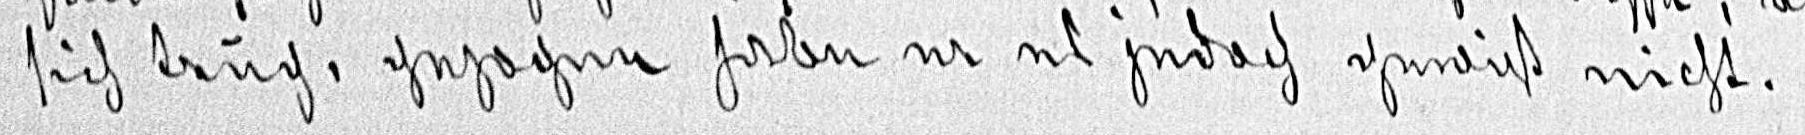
sich trug, gezogen habe er es jedoch gewiß nicht.
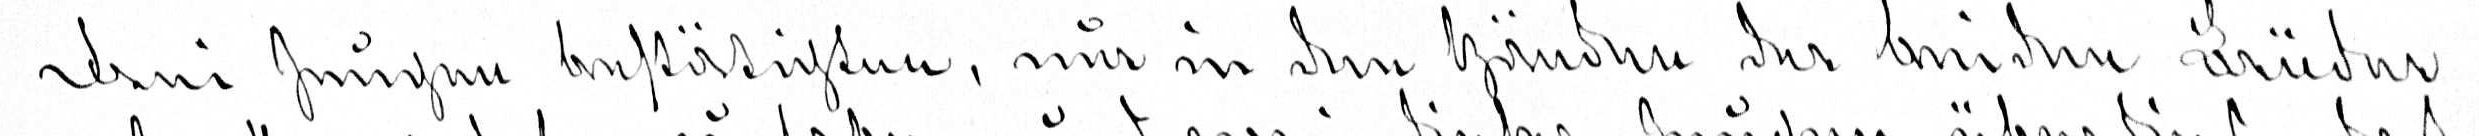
Drei Zeugen bestätigten, nur in den Händen der beiden Brüder
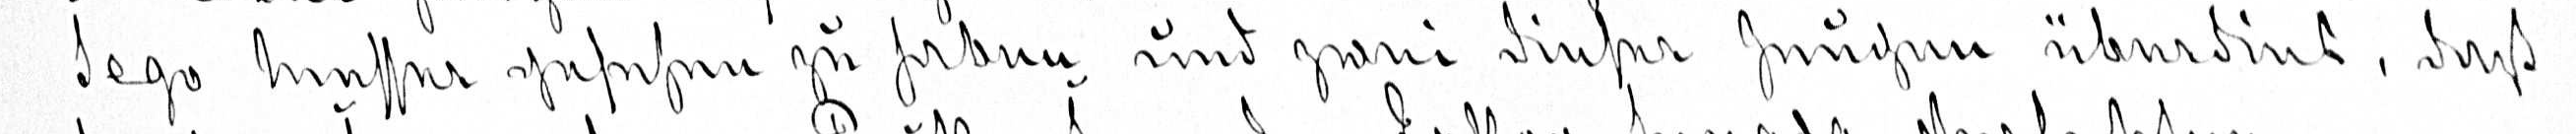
Šego Messer gesehen zu haben, und zwei dieser Zeugen überdies, daß
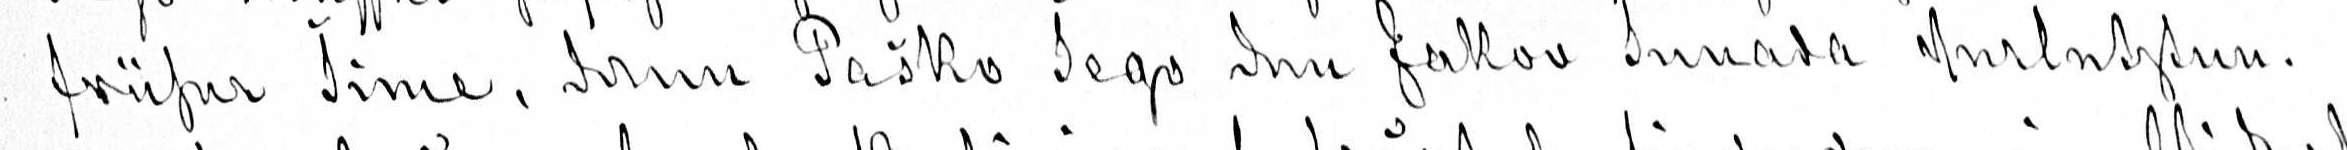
früher Šime, dann Paško Šego den Jakov Iunara verletzten.
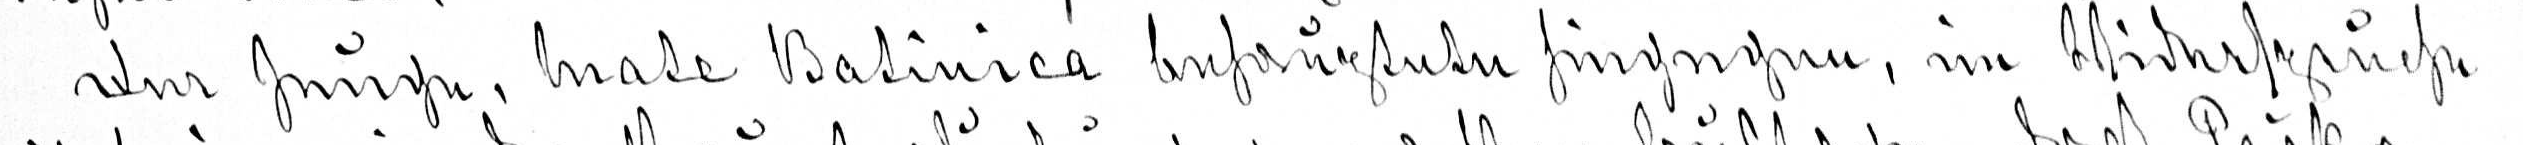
Der Zeuge, Mate Batinica behauptete hingegen, im Widerspruche
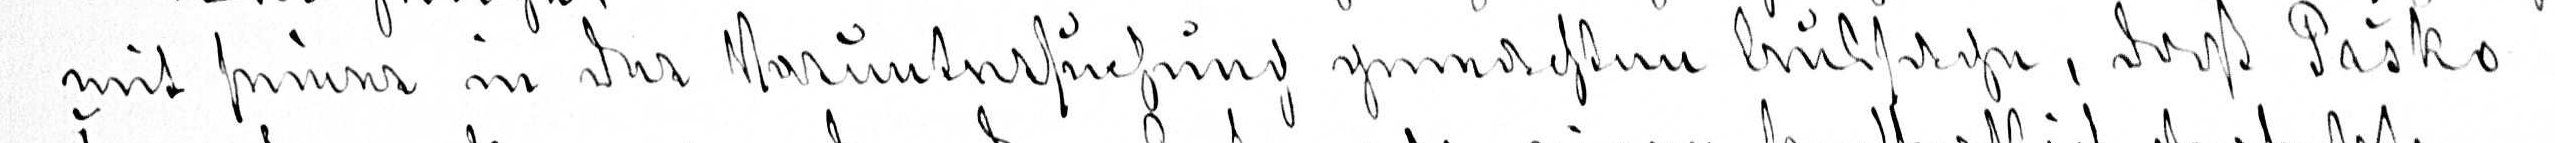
mit seiner in der Voruntersuchung gemachten Aussage, daß Paško
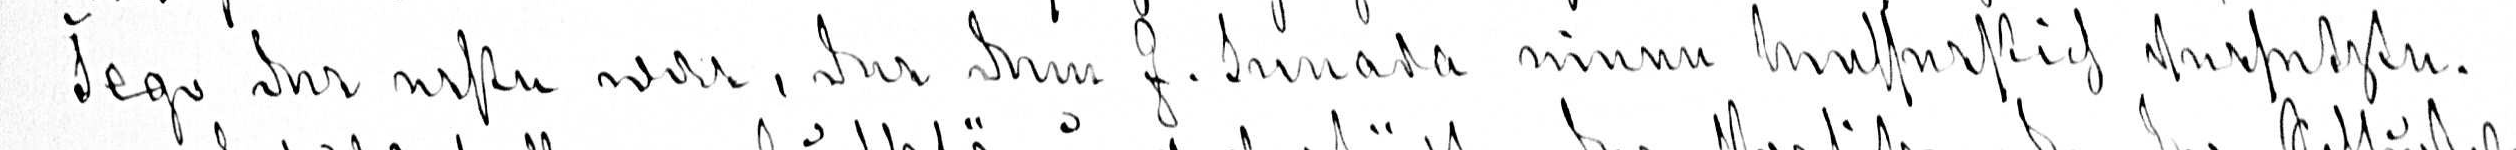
Šego der erste war, der dem J. Iunara einen Messerstich versetzte.
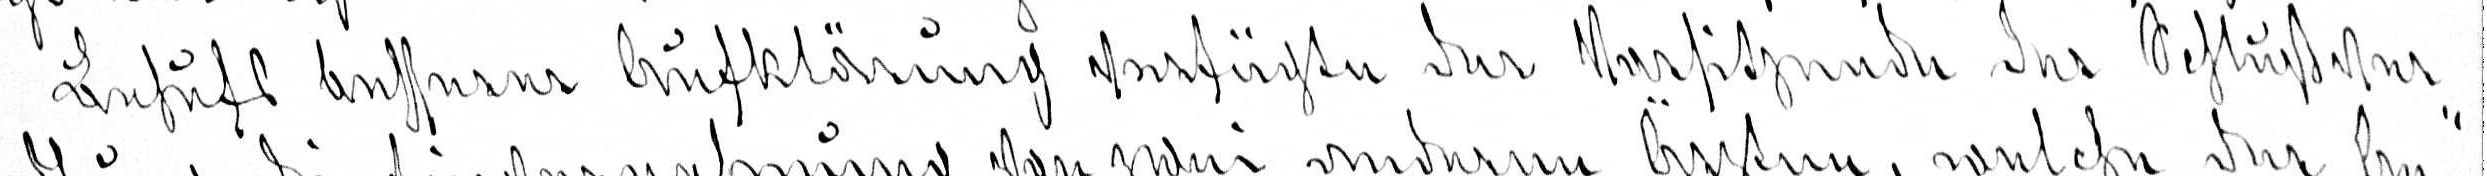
Behufs besserer Aufklärung verfügte der Vorsitzende der Schlußver¬
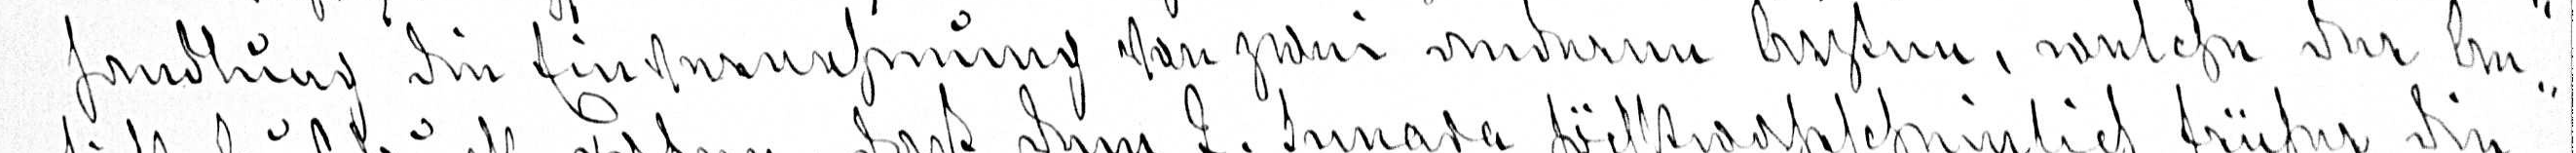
handlung die Einvernehmung von zwei anderen Ärzten, welche der An¬
